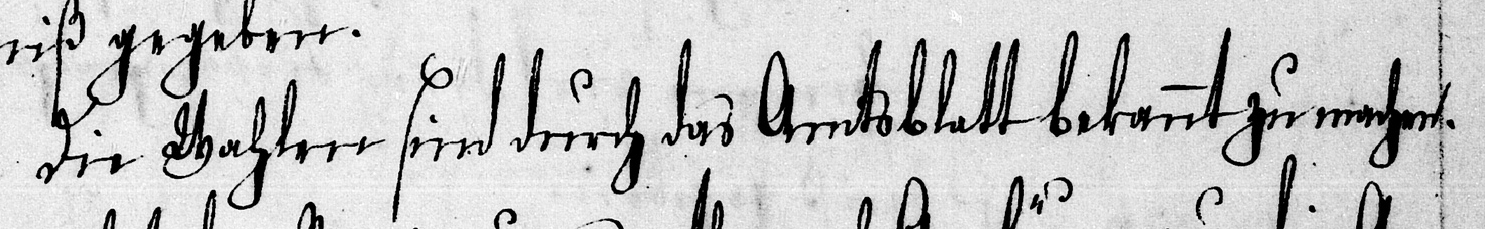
Die Wahlen sind durch das Amtsblatt bekannt zu m¬
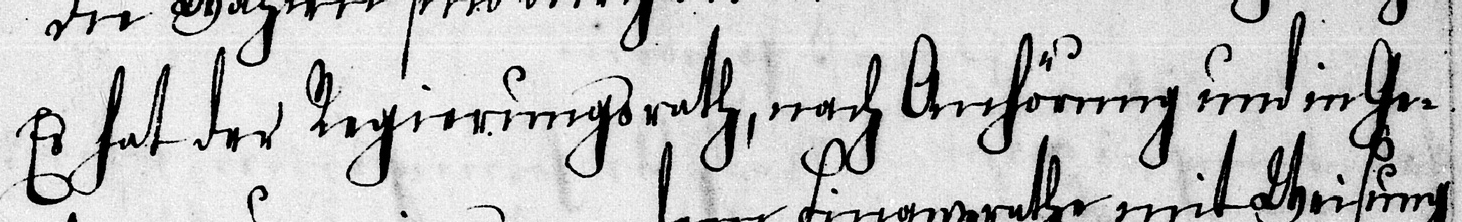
Es hat der Regierungsrath, nach Anhörung und in Ge¬
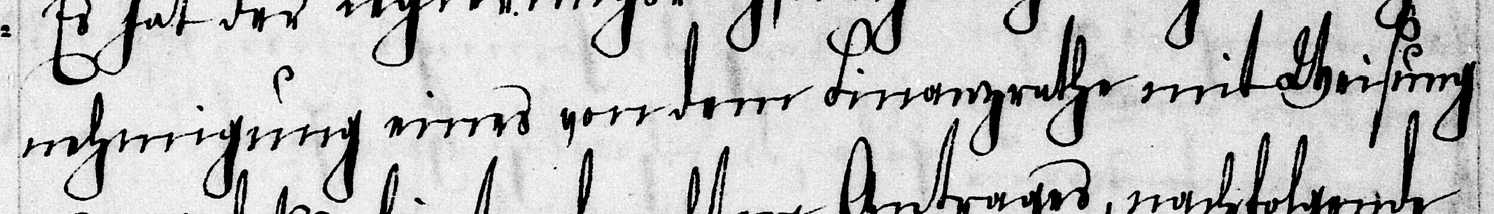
nehmigung eines von dem Finanzrathe mit Weisung
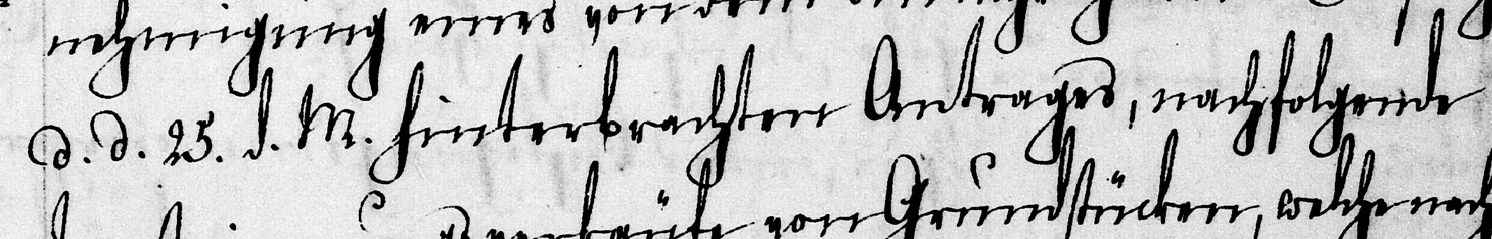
d. d. 25. d. M. hinterbrachten Antrages, nachfolgende
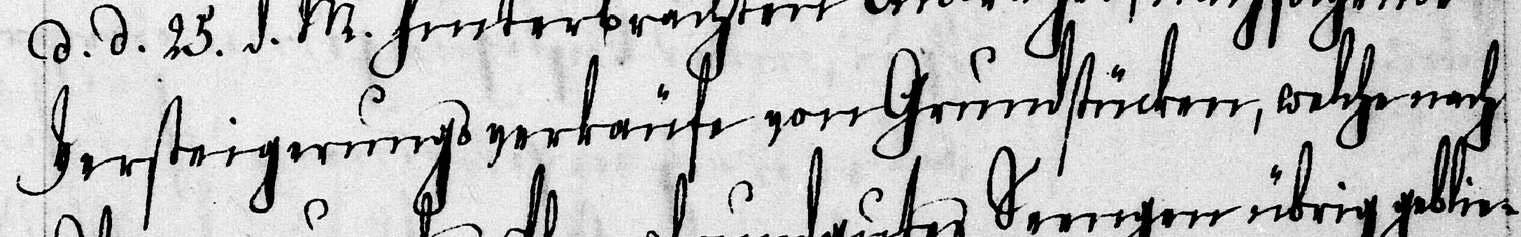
Versteigerungsverkäufe von Grundstücken, welche nach
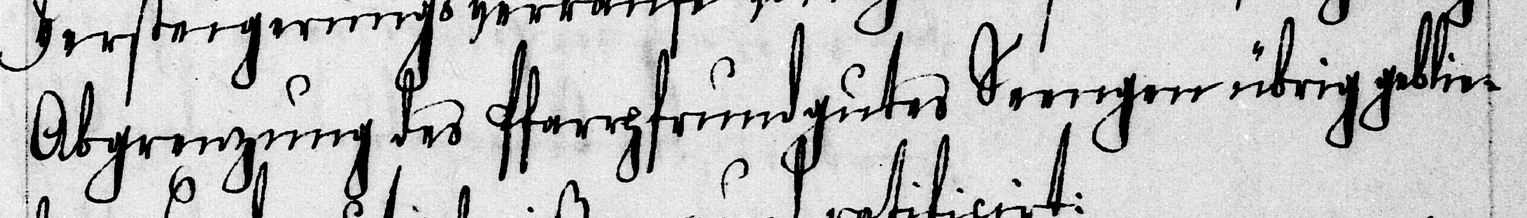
Abgrenzung des Pfarrpfrundgutes Seengen übrig geblie¬
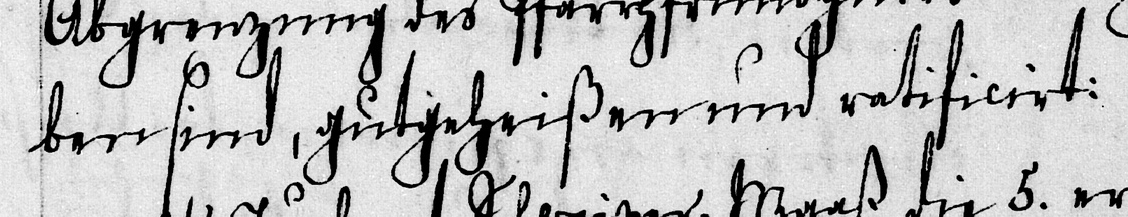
ben sind, gutgeheißen und ratificirt:
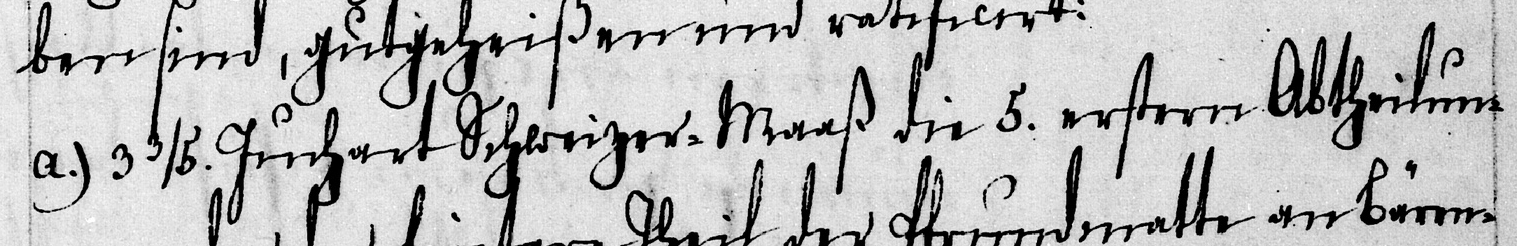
a.) 3 3/5. Juchart Schweizer-Maaß die 5. erstern Abtheilun¬
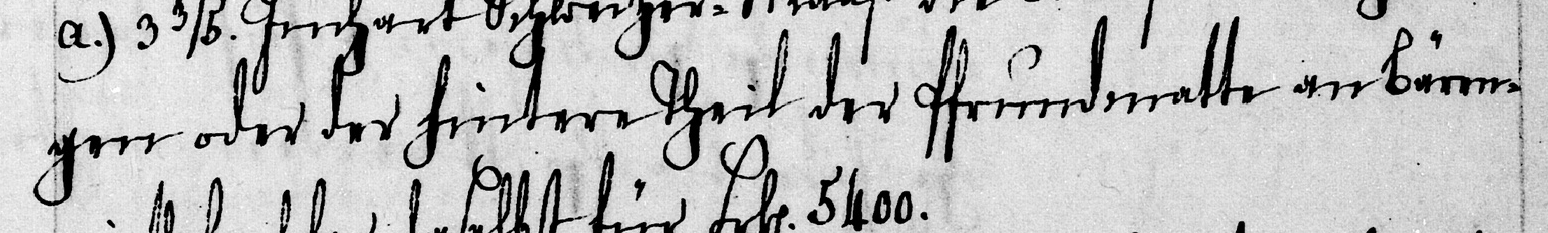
gen oder der hintere Theil der Pfrundmatte an Bären¬
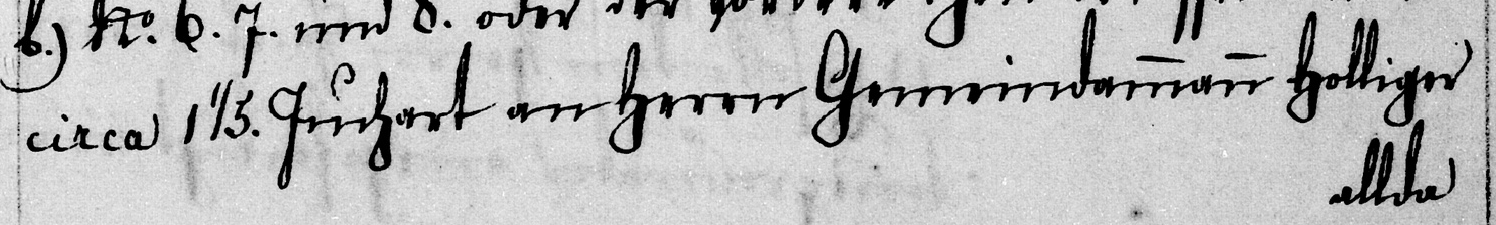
circa 1 1/5. Juchart an Herrn Gemeindammann Holliger
